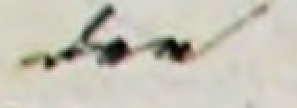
der
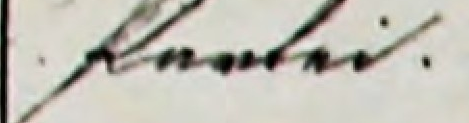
Partei.
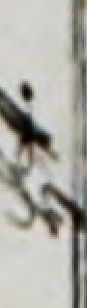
HH.
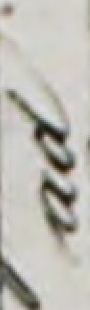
ad
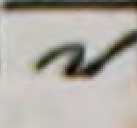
J.
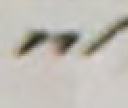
Ck.
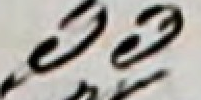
33
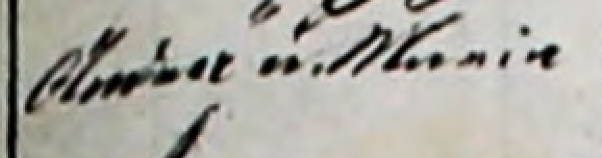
Andrä u. Maria
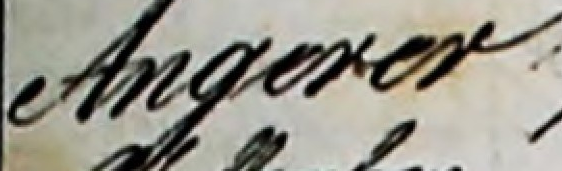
Angerer
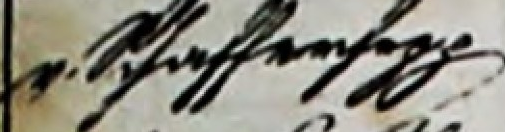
v. Schaffersepp
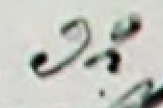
32
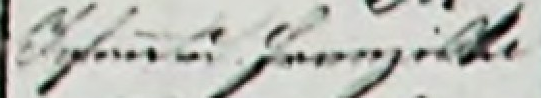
Johann u. Franziska
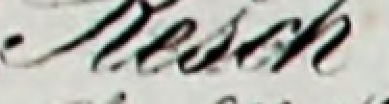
Resch
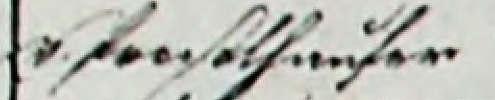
v. Preßlhauser
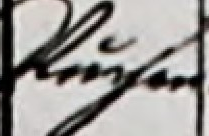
Puchen
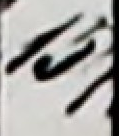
15
